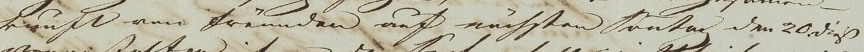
kunft von Freunden auf nächsten Sonntag den 20. dieß
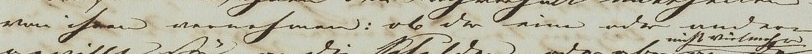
von ihnen vernehmen: ob der eine oder andere
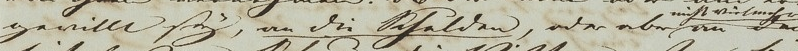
gewillt sey, an die Schulden, oder aber nicht vielmehr an
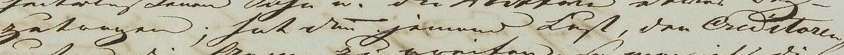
zutragen; hat dann jemand Lust, den Creditoren
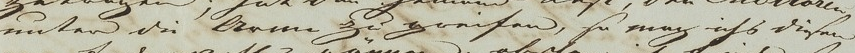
unter die Arme zu greifen, so mag ichs diesen
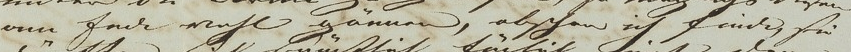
am Ende wohl gönnen, obschon ich finde, sie
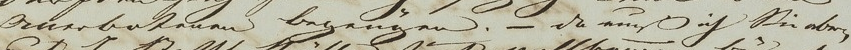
Anerbotenen begnügen. – Da muß ich Sie aber,
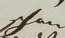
schon
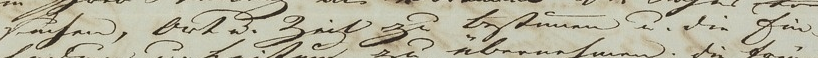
suchen, Ort u. Zeit zu bestimmen u. die Ein-
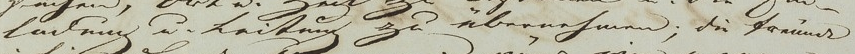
ladung u. Leitung zu übernehmen; die Freunde
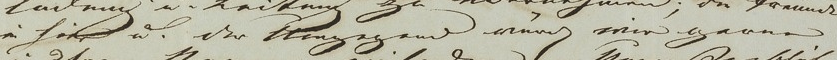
in Hier u. der Umgegend würden wir gerne
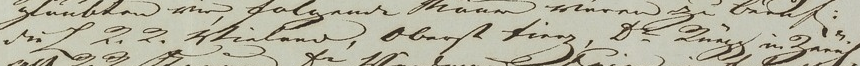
die Herren R.R. Wieland, Oberst Fierz, DrRüegg in Zürich,
